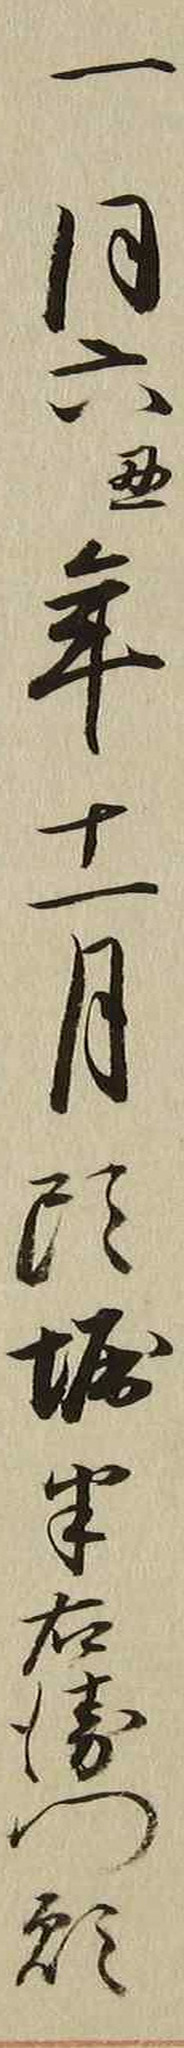一同六丑年十一月頭堀半右衛門願
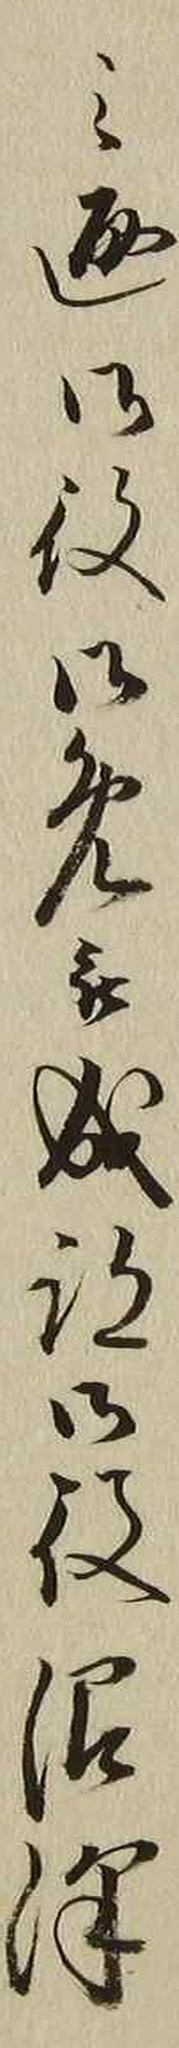之通御役御免被成跡御役沼澤
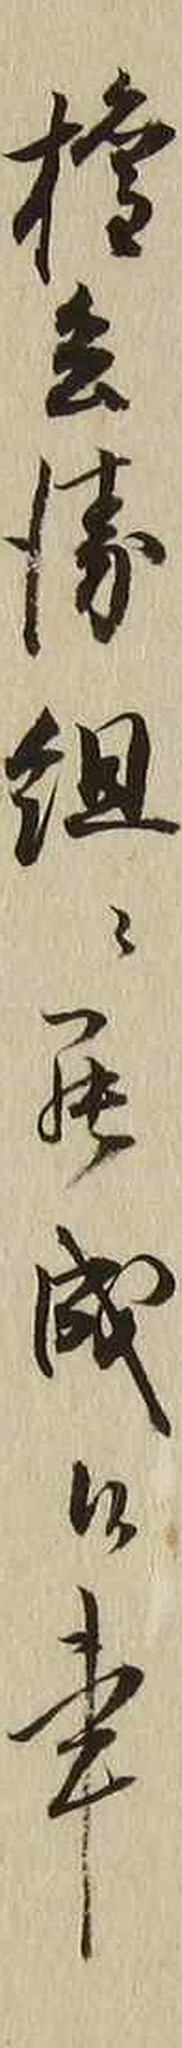権兵衛組ニ罷成候事
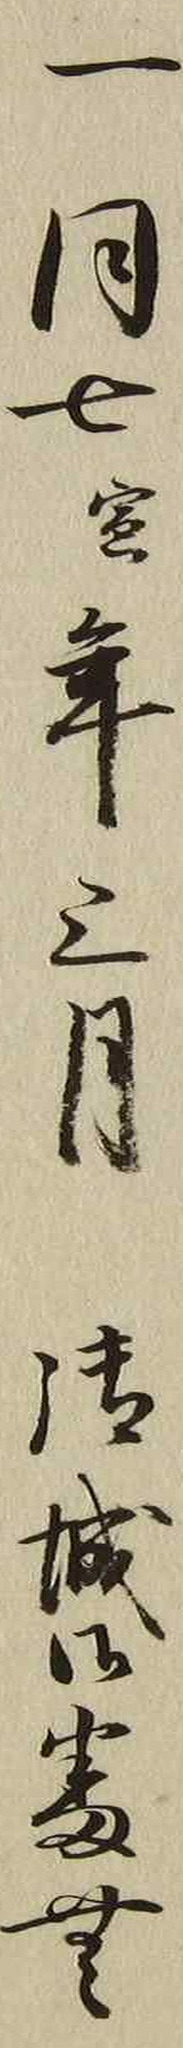一同七寅年三月御城御番無
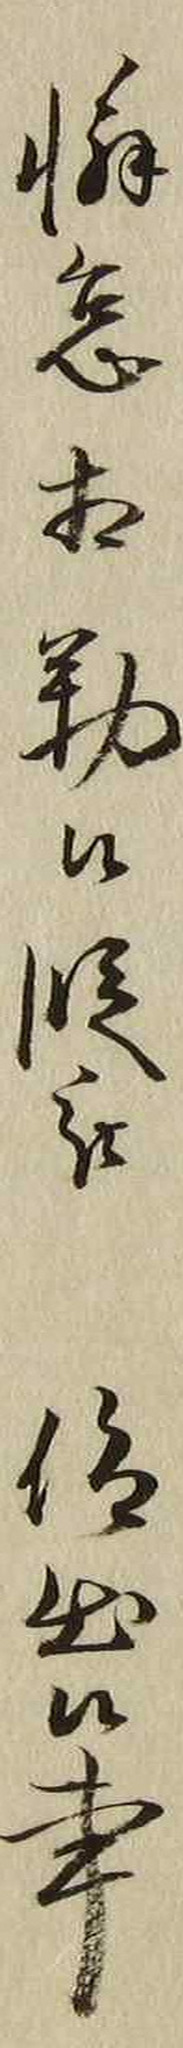懈怠相勤候段被仰出候事
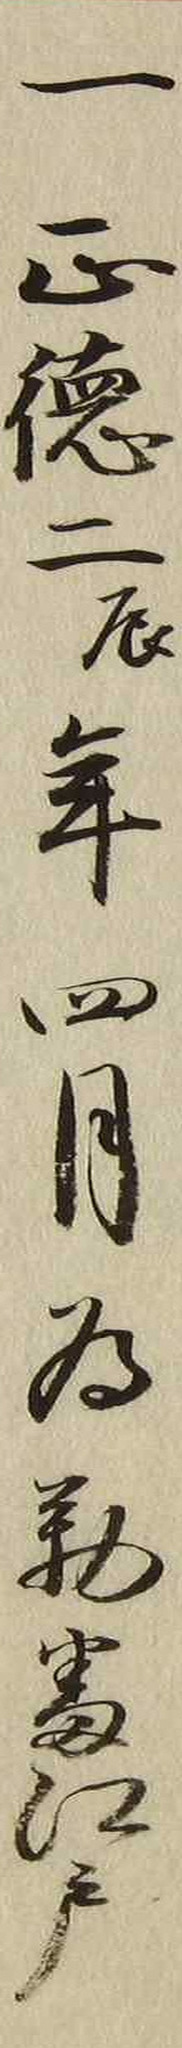一正徳二辰年四月為勤番江戸
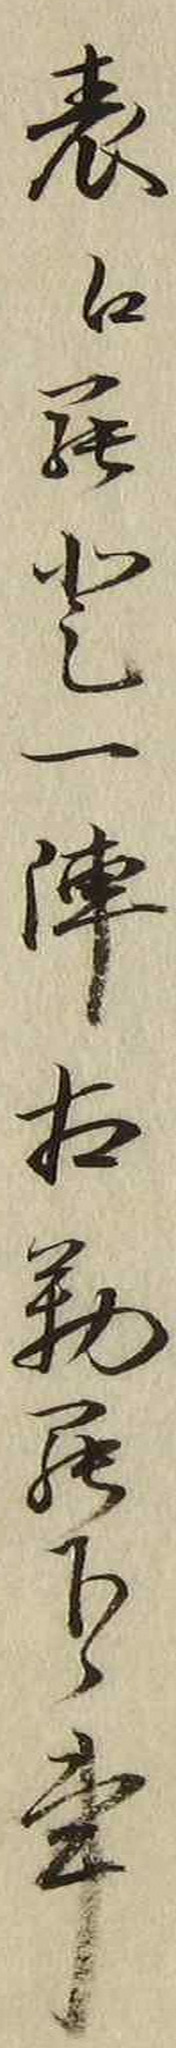表江罷登一陣相勤罷下候事
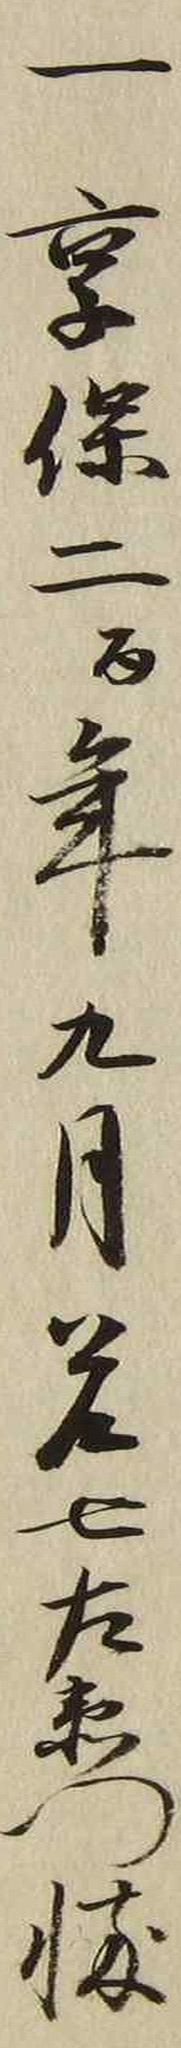一享保二酉年九月兄七左衛門忰
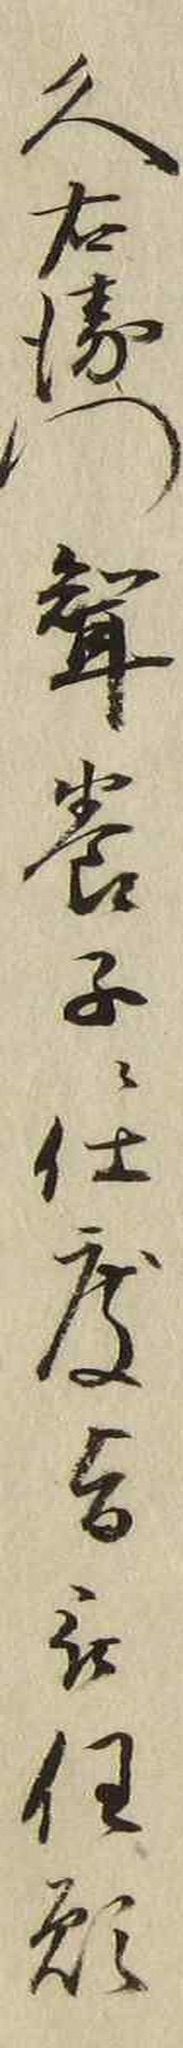久右衛門婿養子ニ仕度旨被任願

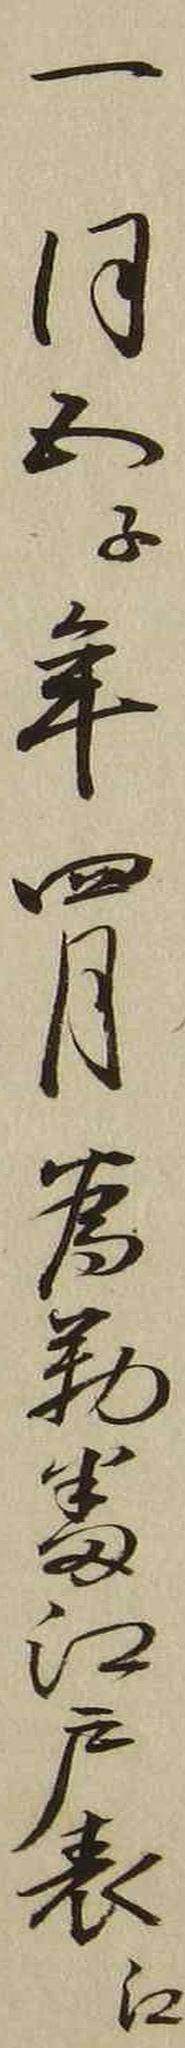一同五子年四月為勤番江戸表江
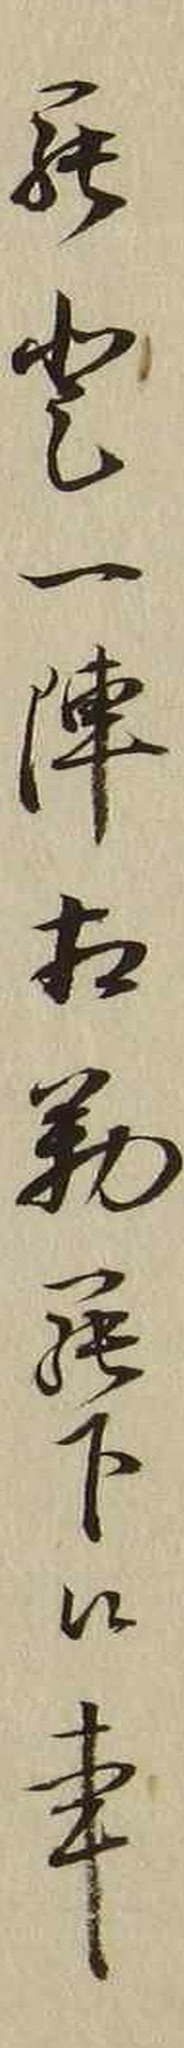罷登一陣相勤罷下候事
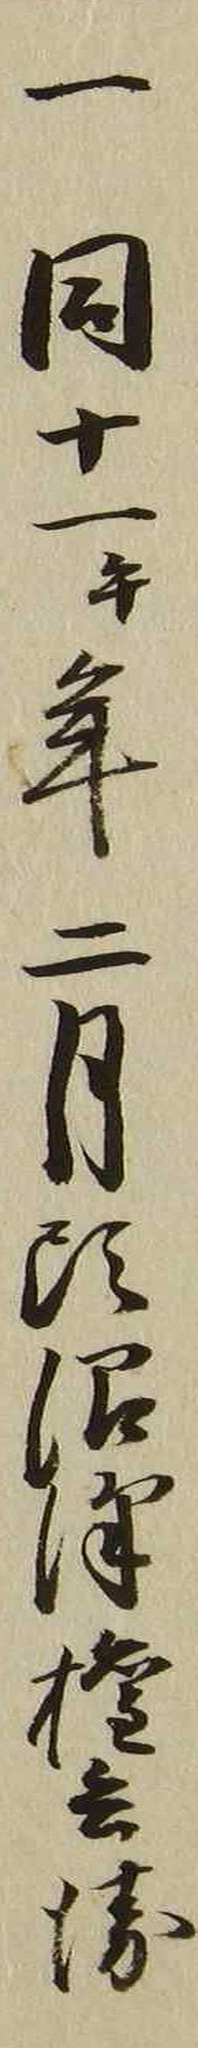一同十一午年二月頭沼澤権兵衛
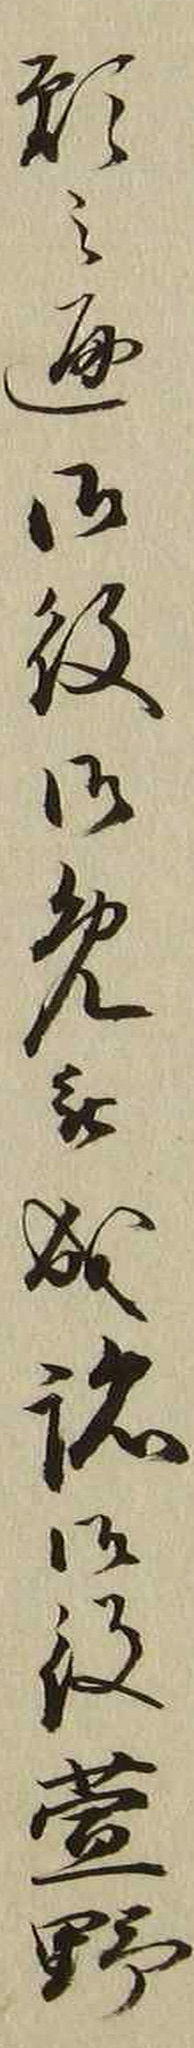願之通御役御免被成跡御役萱野
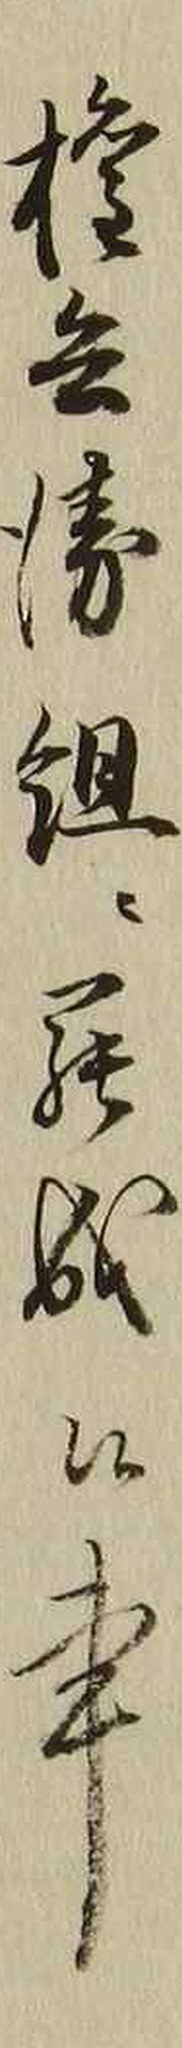権兵衛組ニ罷成候事
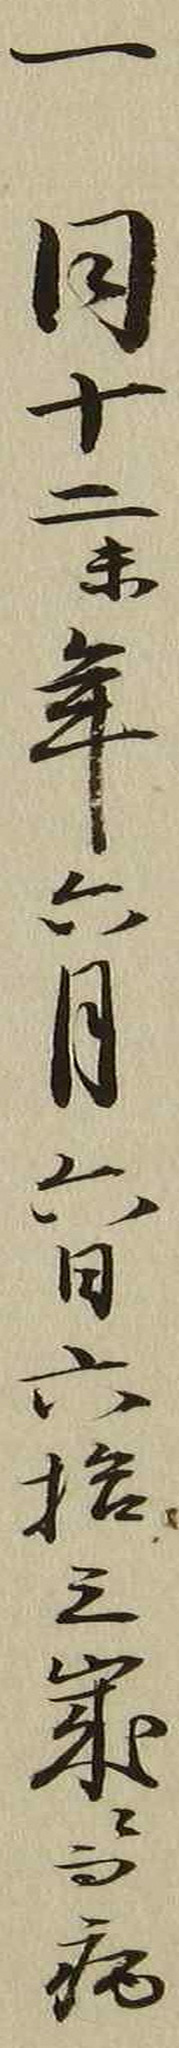一同十二未年六月六日六拾三歳ニ而病
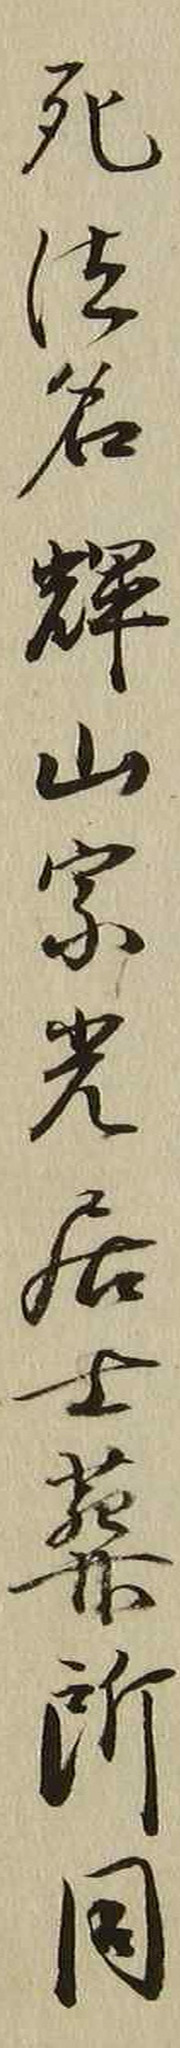死法名輝山宗光居士葬所同
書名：諸士系譜　巻之69　を之部3
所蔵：会津若松市立会津図書館
